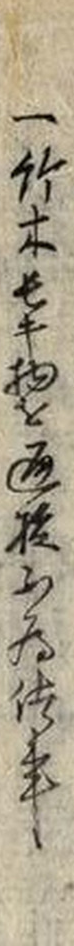一竹木長き物を通抜不為仕候事
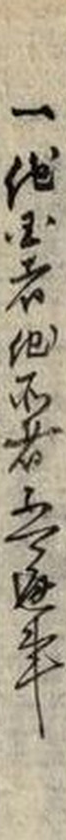一他国者他所者不可通事
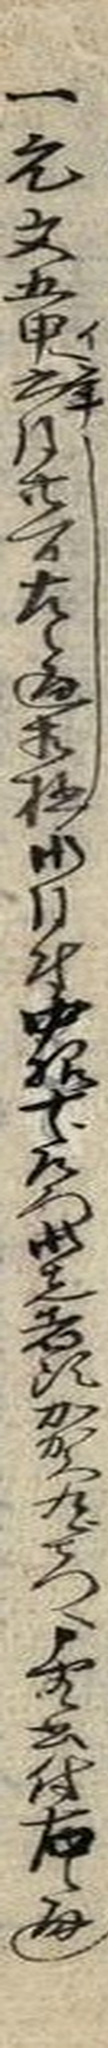一元文五申年六月廿一日左之通相極御目付中根十郎左衛門御先者頭加賀九郎右衛門へ申聞書付右之通
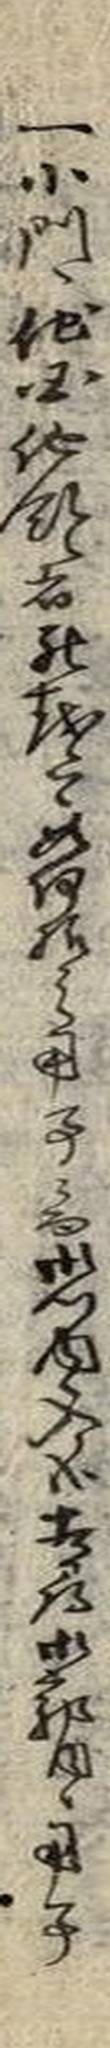一小門へ他国他領之者罷越候ハヽ如何様之御用ニ而御門内へ入候哉相尋御郭内ニ用事
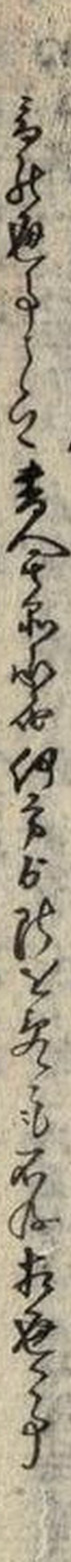に而罷通事に候はゝ番人其品承届何方ゟ断を受候にも不及相通候事
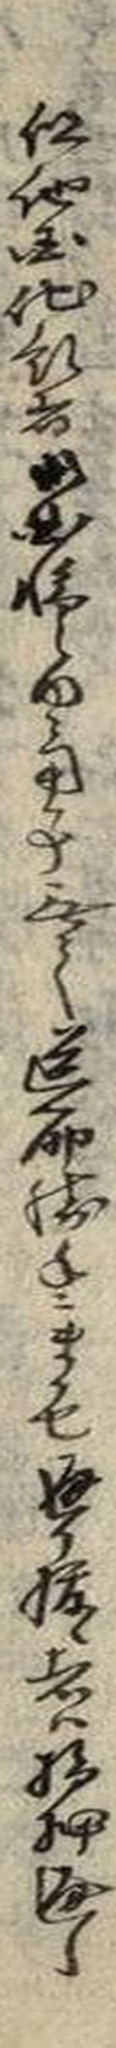但他国他領者御曲輪之内に用事無之道筋勝手にまかせ通り抜候者は指押通し
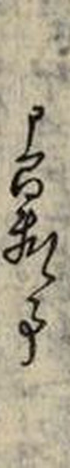申間敷候事
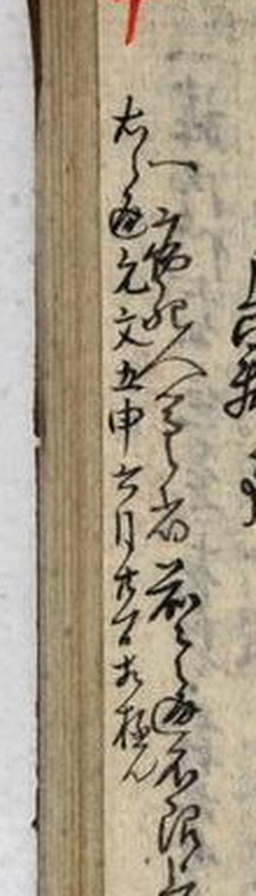右之通元文五申六月廿一日相極ル
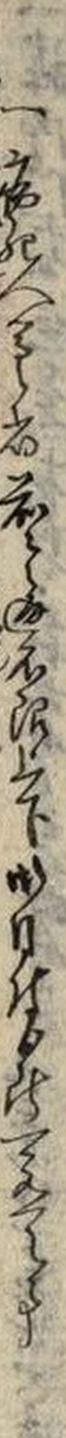一病死人等之者前々之通不限上下御目付ゟ断可有之候事

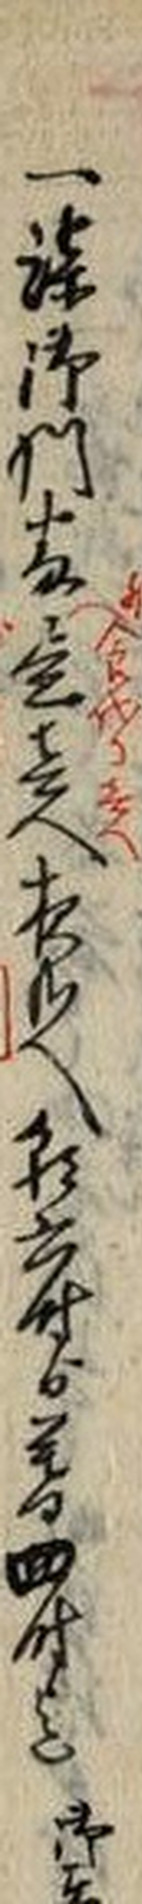一川口御門番昼壱人夜弐人朝六時ゟ夜四時迄
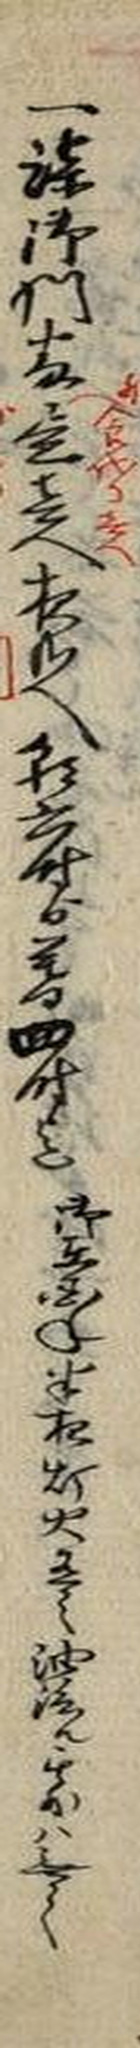一漆御門番昼壱人夜弐人朝六時ゟ暮四時迄御在国年半夜灯火有之油渡ル其外は無之
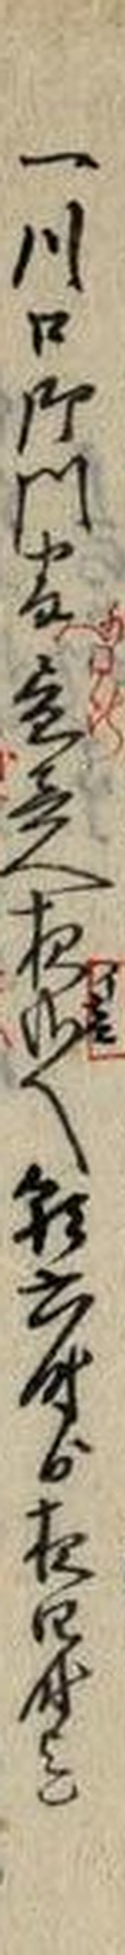一川口御門番昼壱人夜弐人朝六時ゟ夜四時迄
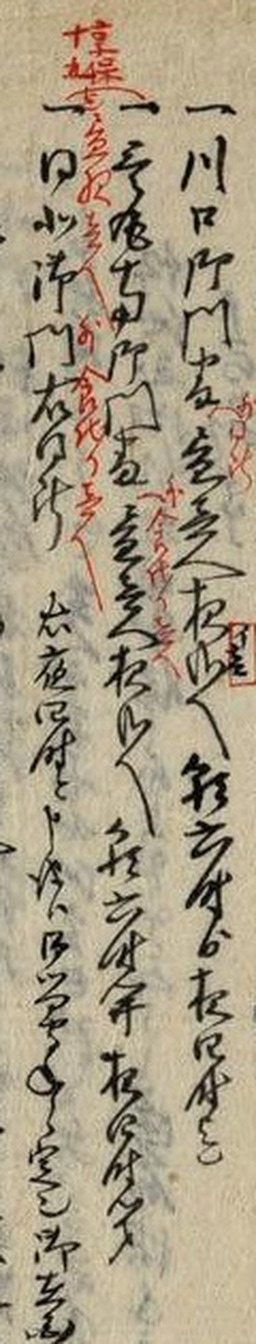一三之丸南門番昼壱人夜弐人朝六時開夜四時閉
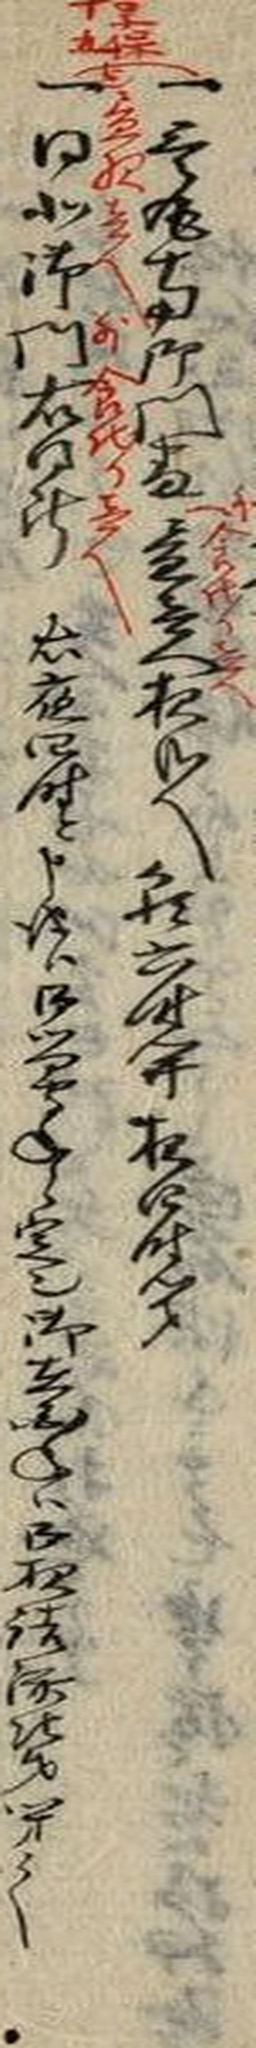一同北御門右同断右夜四時と申儀は御留守年之定也御在国年は御夜詰済次第閉之
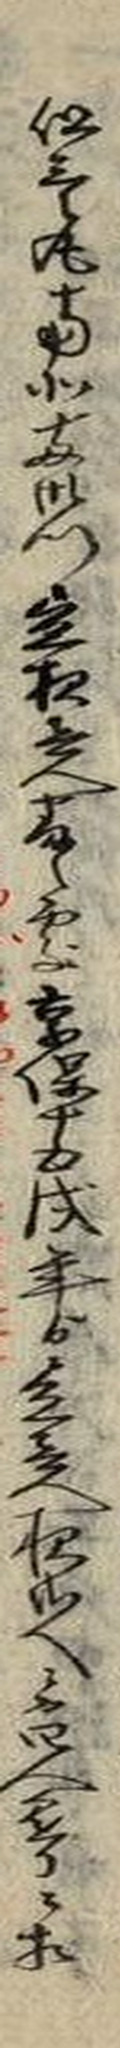但三之丸南北両御門昼夜壱人番之処享保十五戌年ゟ昼壱人夜弐人に而四人懸りに相
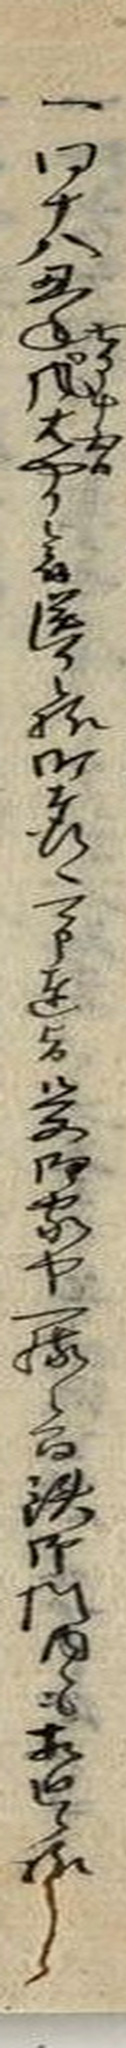一同十八丑年七月十五日風はやり候に付送り候様御奉行へ可申達旨且又御家中一統候間鉄御門内へも相廻候様
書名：御門御櫓之部
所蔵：福井県文書館 Fukui Prefectural Archives
